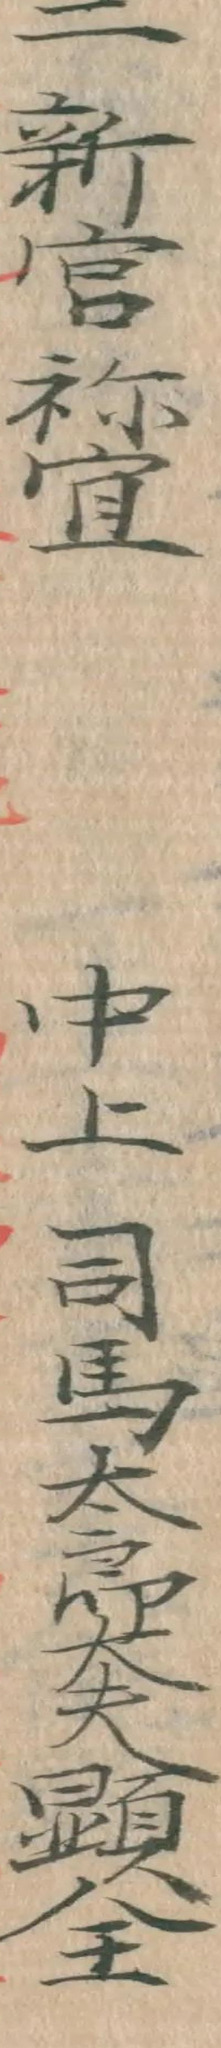二新宮祢宜中上司馬太郎大夫顕全
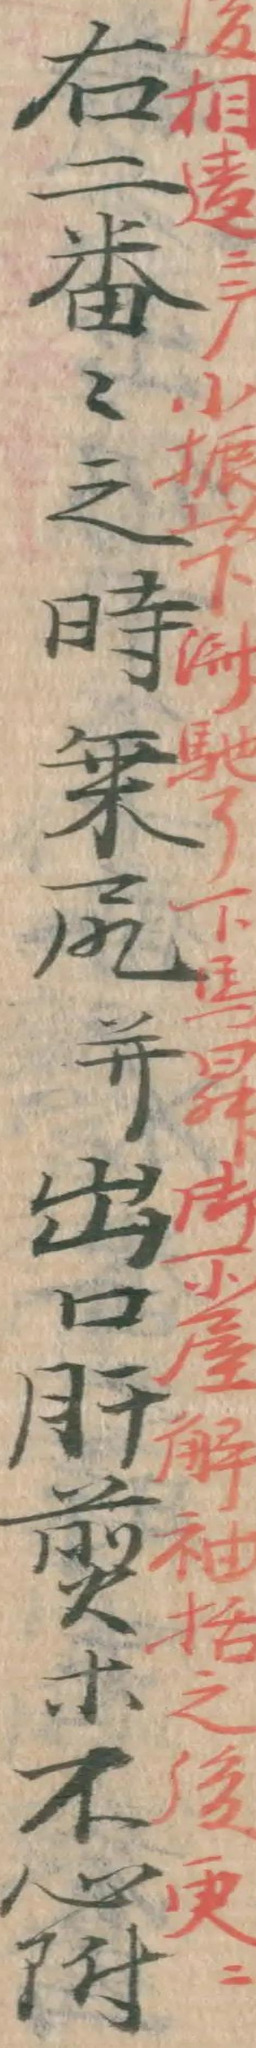右二番々之時乗尻并出口肝煎等不心附
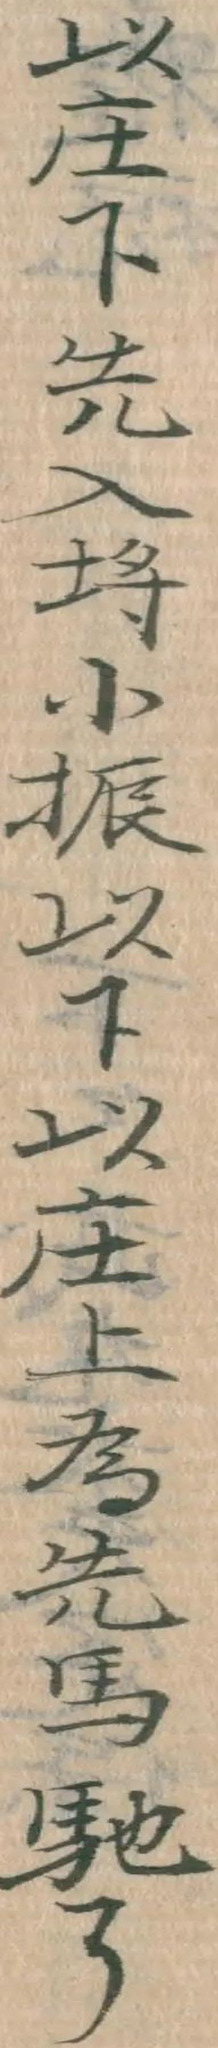以庄下先入埒小振以下以庄上為先馬馳了
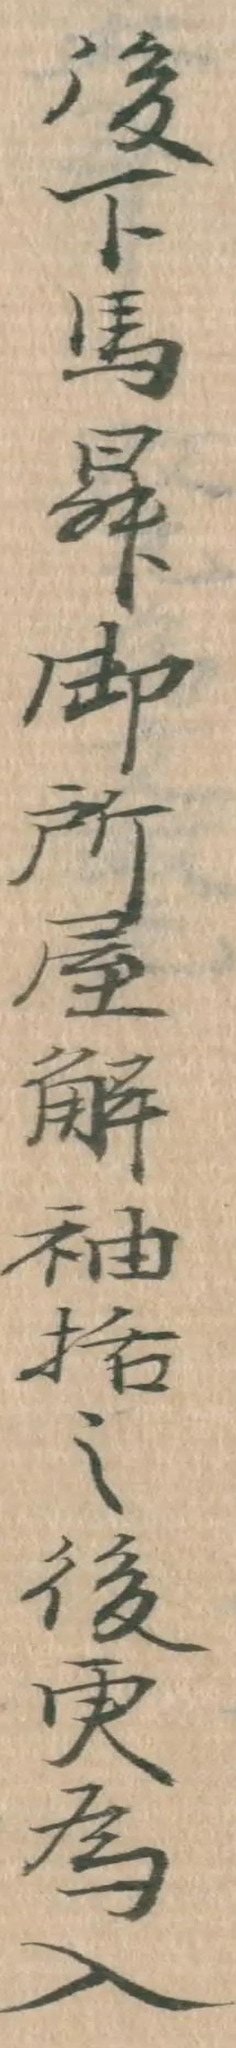後下馬昇御所屋解袖括之後更為入
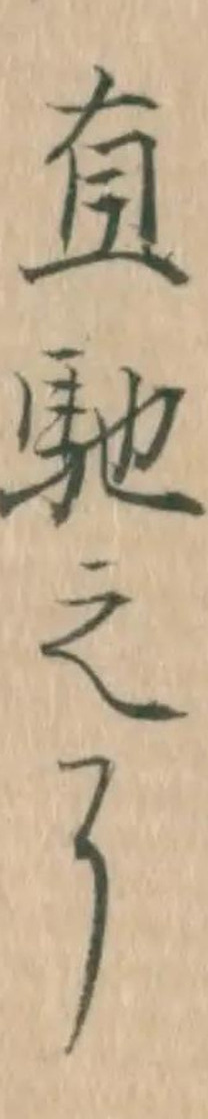直馳之了
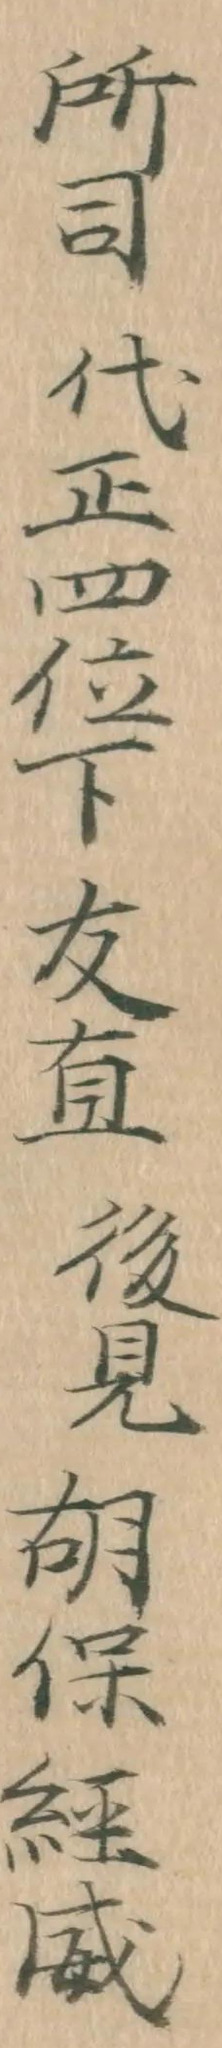所司代正四位下友直後見胡保経威
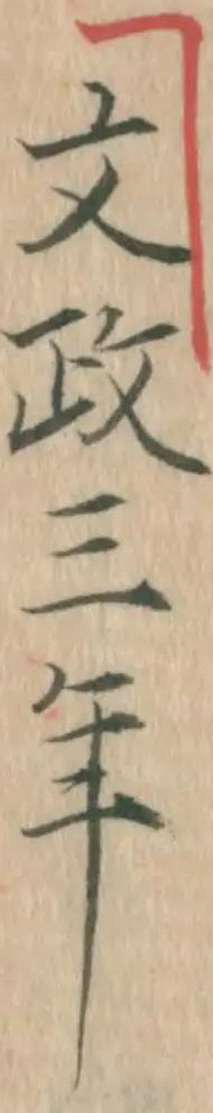文政三年
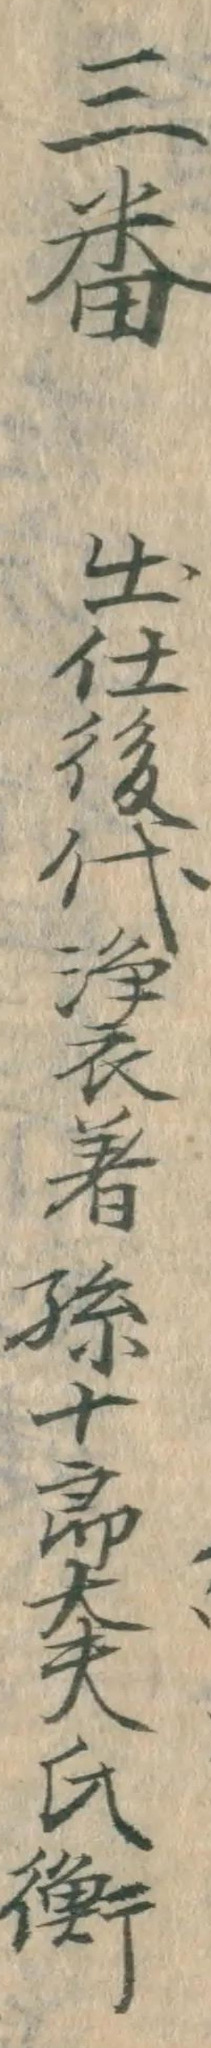三番出仕後代浄衣着孫十郎大夫氏衡
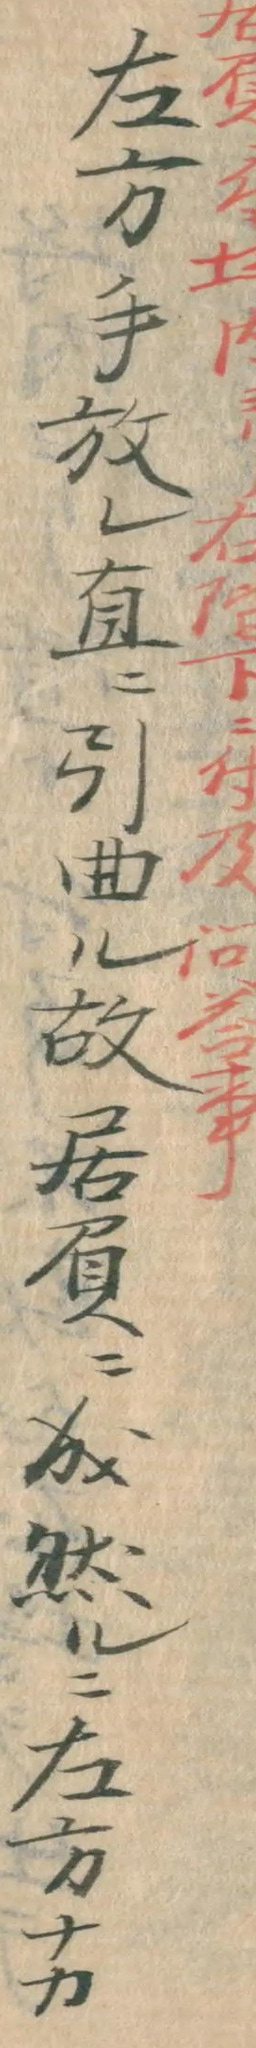左方手放レ直ニ引曲ル故居負ニ成然ルニ左方ナカ
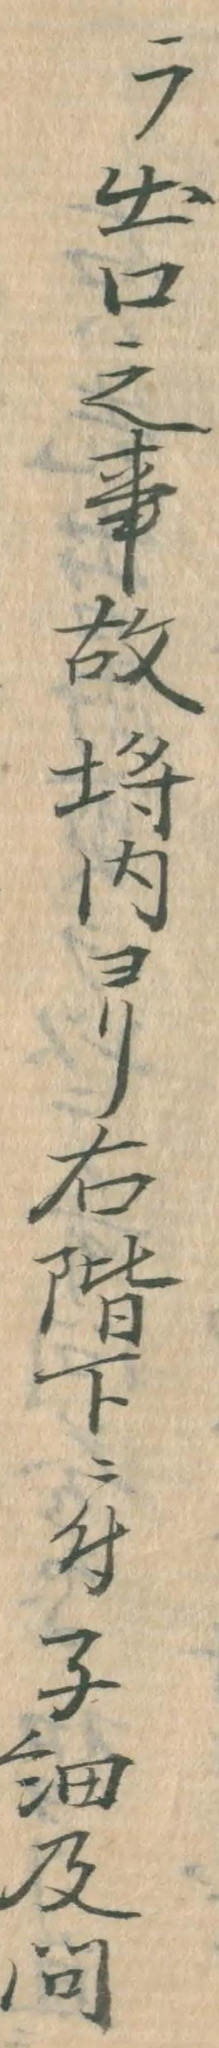ラ出口之事故埒内ヨリ右階下ニ付子細及問
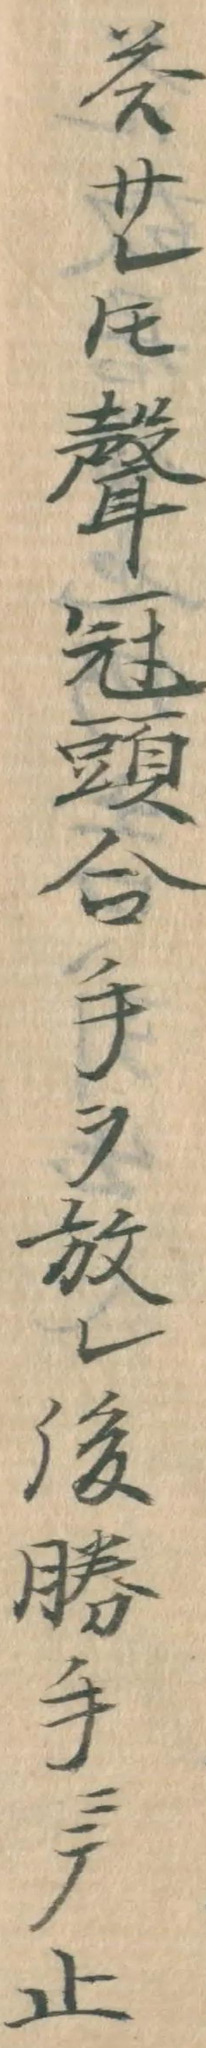答サレトモ声冠頭合手ヲ放レ後勝手ニテ止

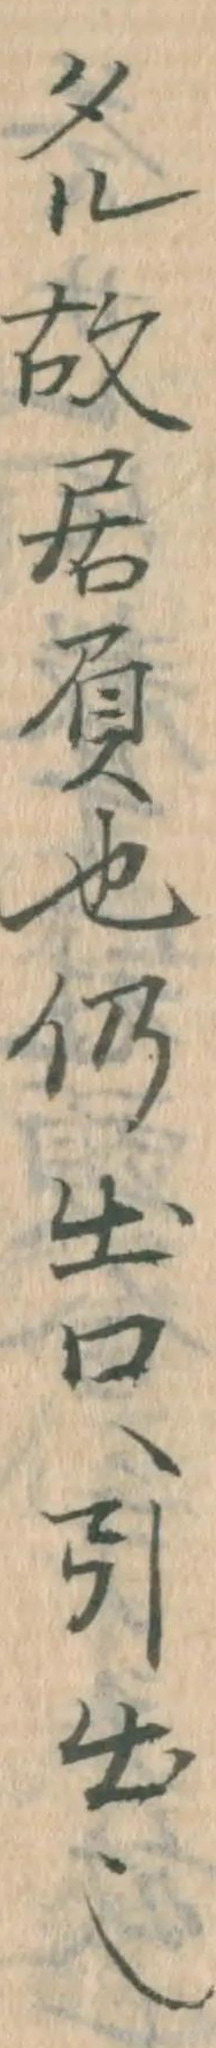タル故居負也仍出口ヘ引出也
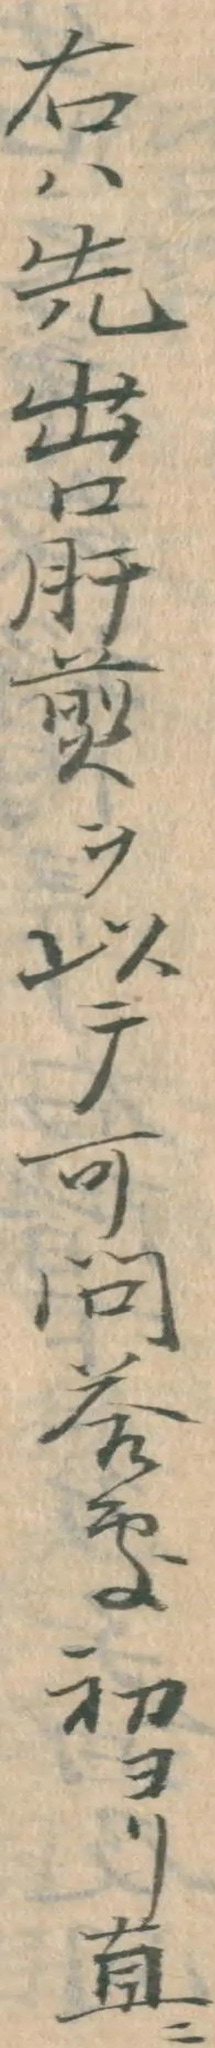右ハ先出口肝煎ヲ以テ可問答処初ヨリ直ニ
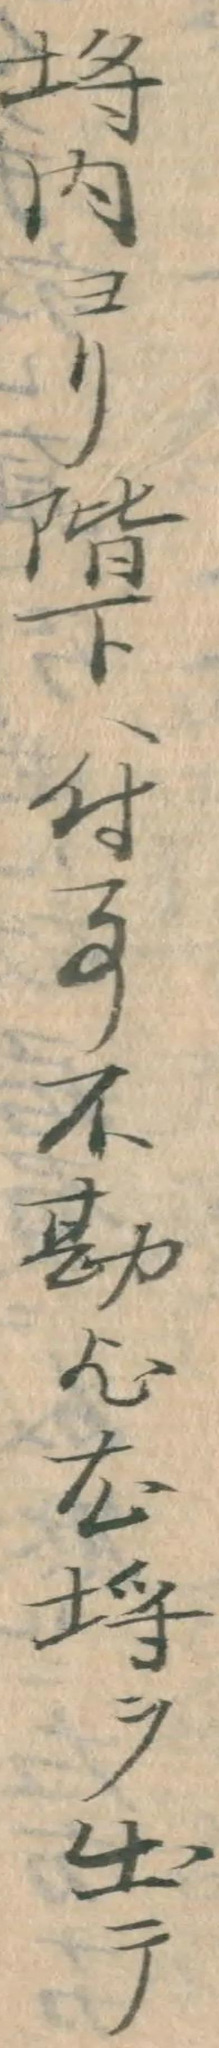埒内ヨリ階下へ付事不勘心尤埒ヲ出テ
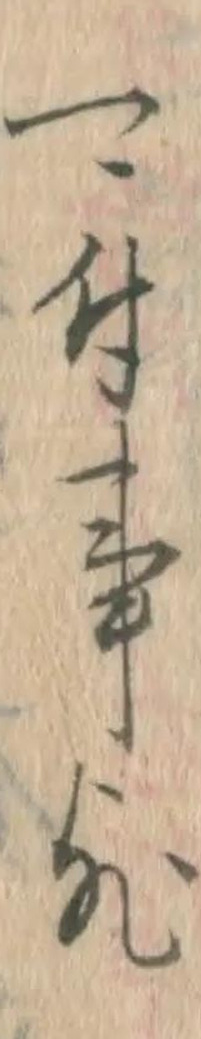可付事歟
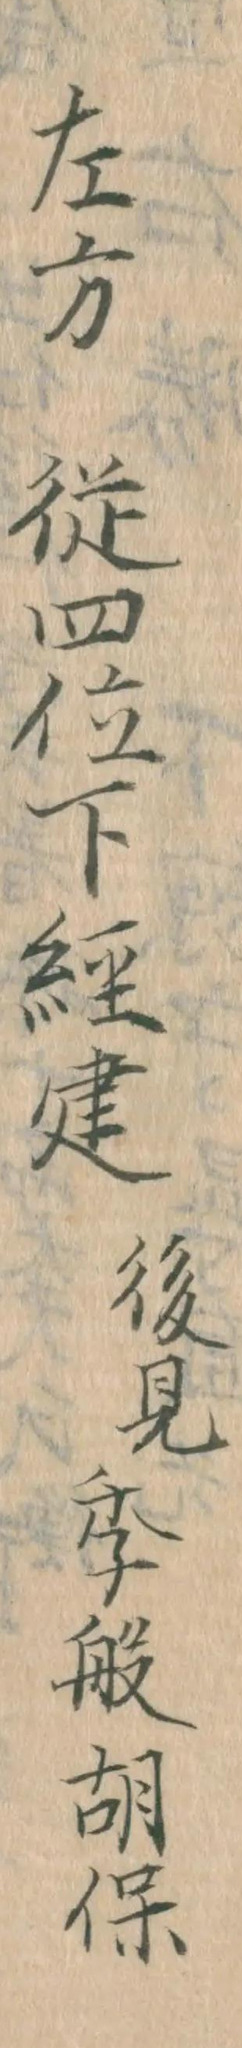左方従四位下経建後見季般胡保
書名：賀茂社記録. 第10冊
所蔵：国立国会図書館 National Diet Library, JAPAN
